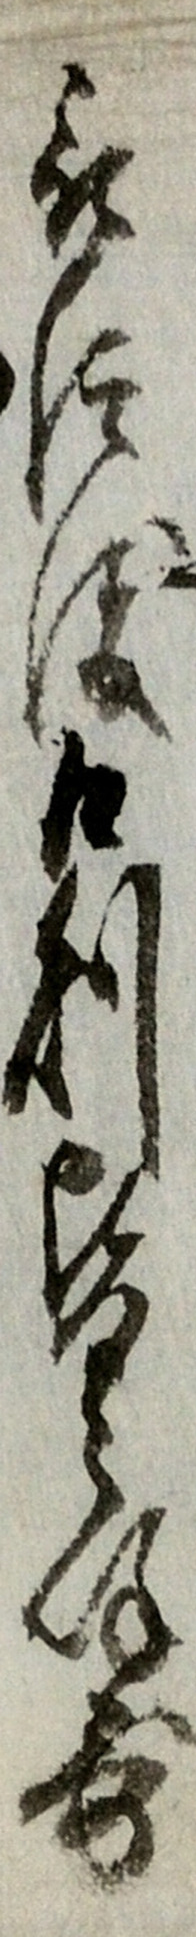被仰渡候別皆々呼寄
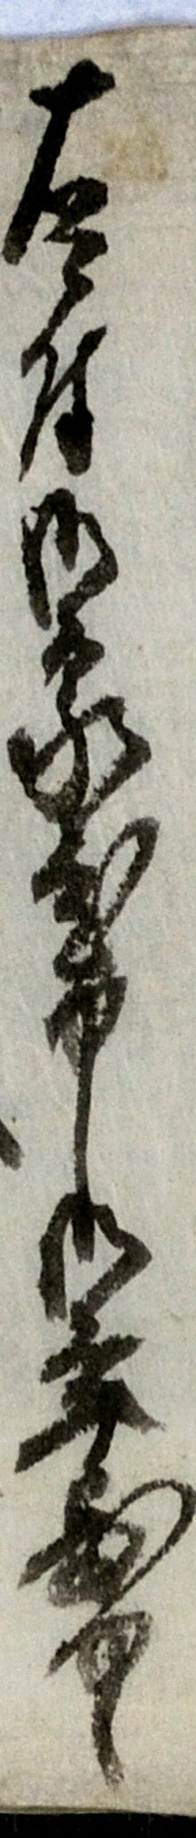右に付御家老中御年寄中
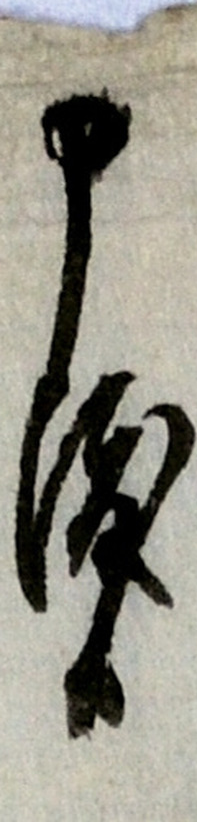申渡候
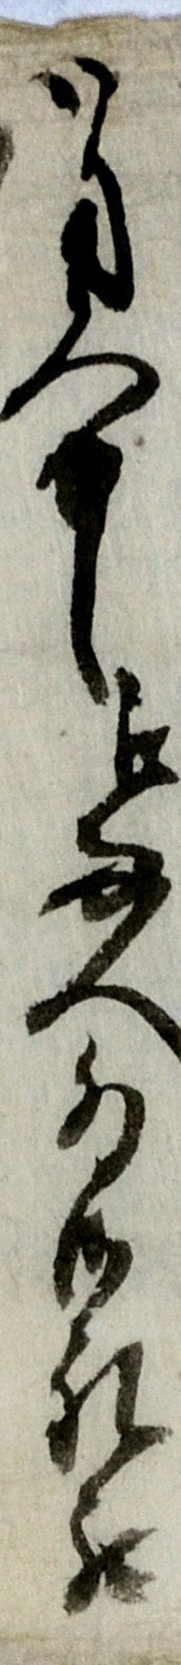御用人中え両人為御礼罷
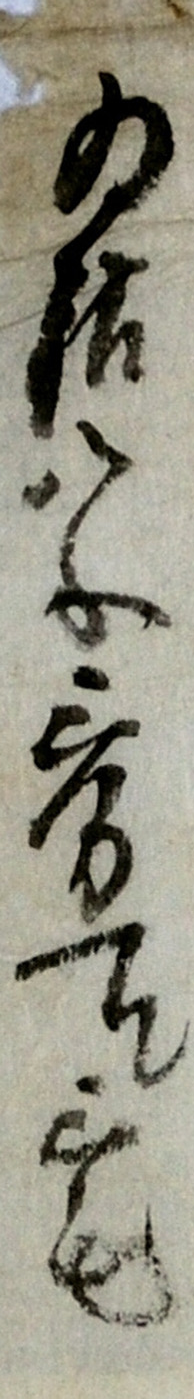為銀八匁三分一厘三毛
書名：分一方諸事御用留帳
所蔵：伊那市立高遠町図書館・合同会社AMANE
